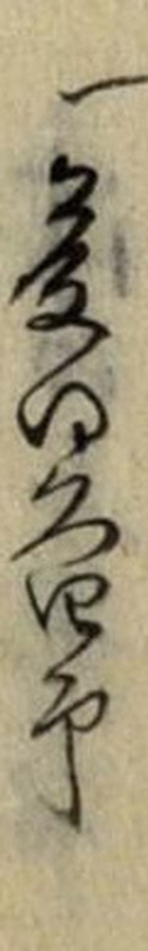藤田久四郎
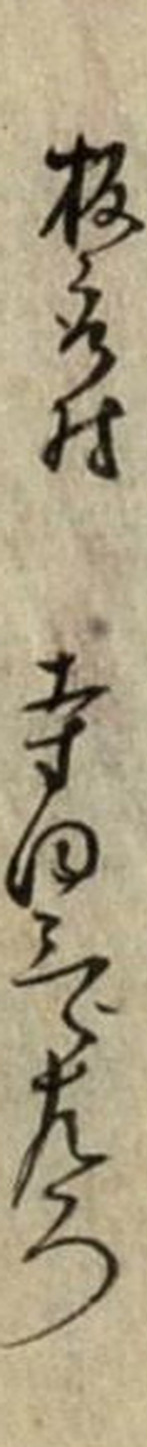提板取村寺田三郎左衛門
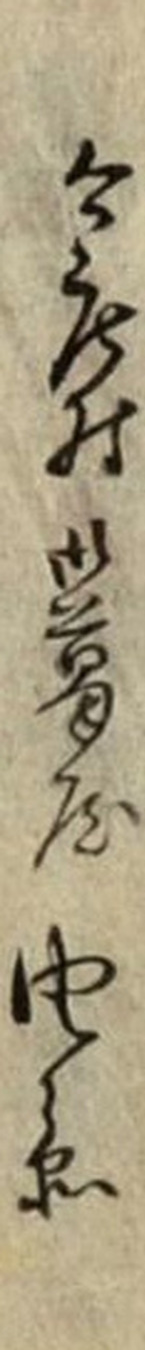同今庄村御葛屋由兵衛
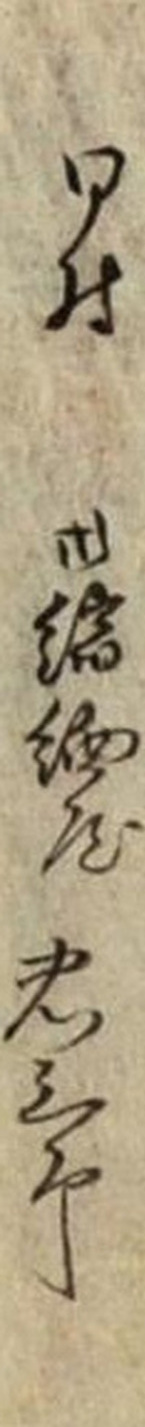同同村御縮緬屋忠三郎
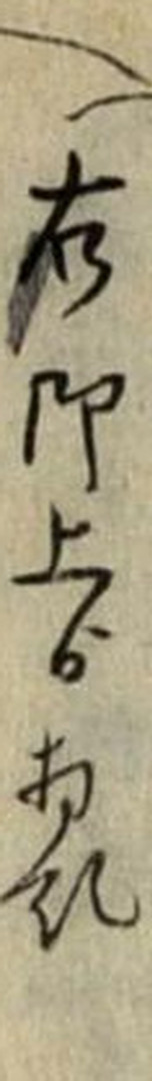右御上ゟ拝領
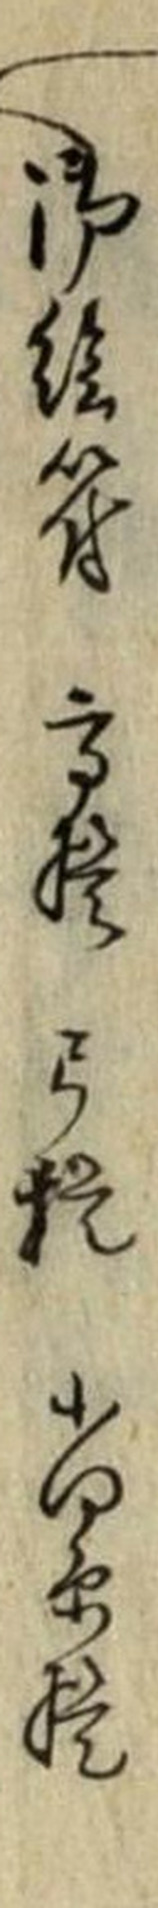御絵符高提弓提小田原提
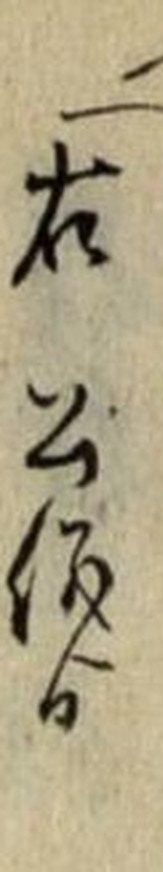右公儀ゟ
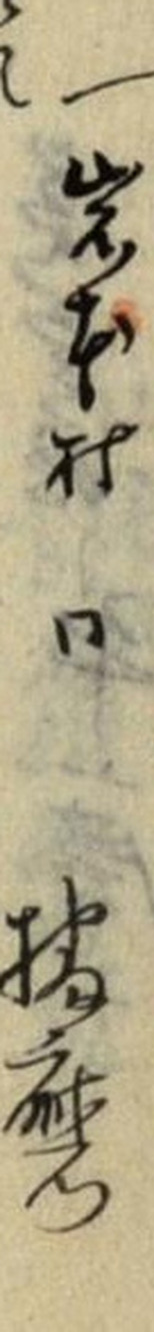岩本村同播磨

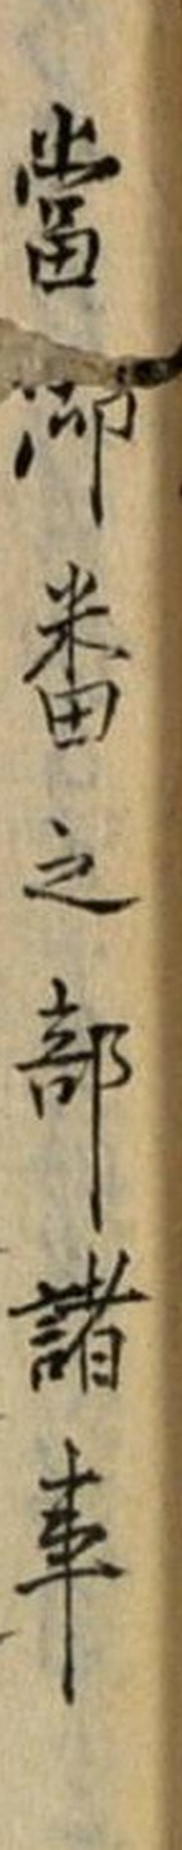当御番之部諸事
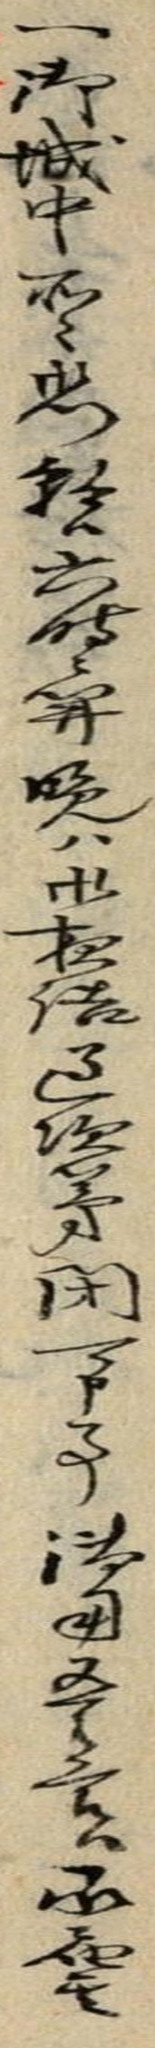一御城中所々御門朝は六時に開晩は御夜詰過次第閉可申事御用有之節は承届其
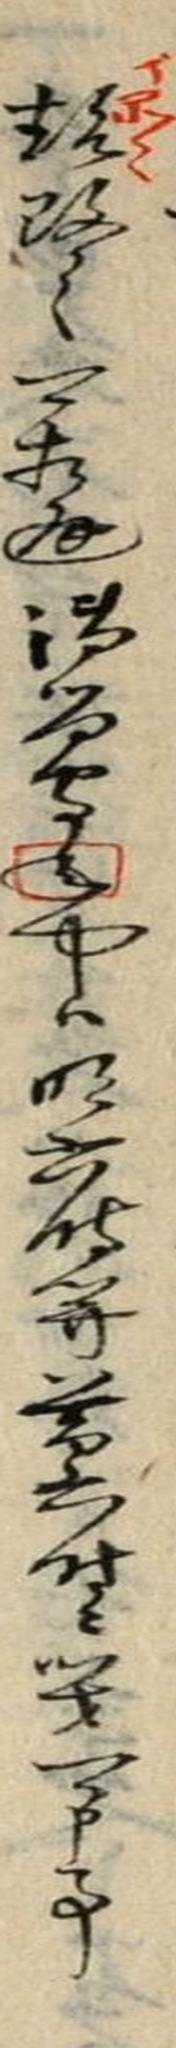趣改之可相通御留守年中は明六時開暮六時に閉可申事
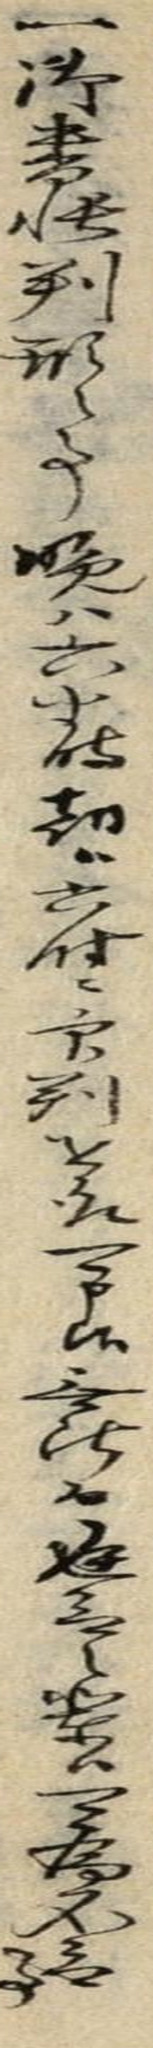一御番帳判形之事晩は六半時朝は六時に印判を取可申候無断而遅参之輩は可為不参事
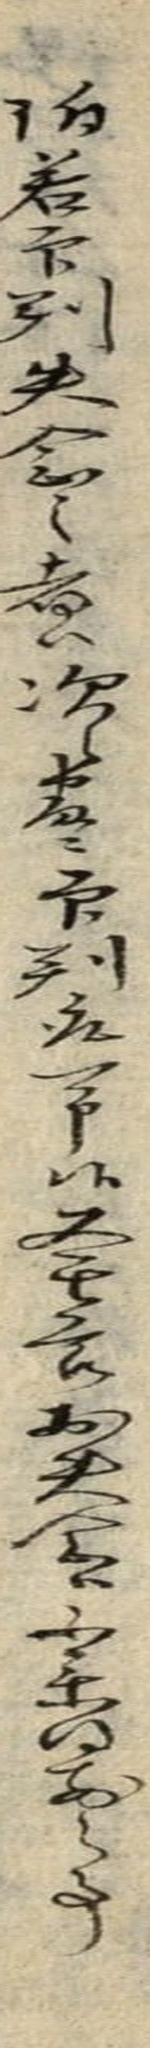附若印判失念之者は次之番に印判取可申候又其節於失念は不参同前之事
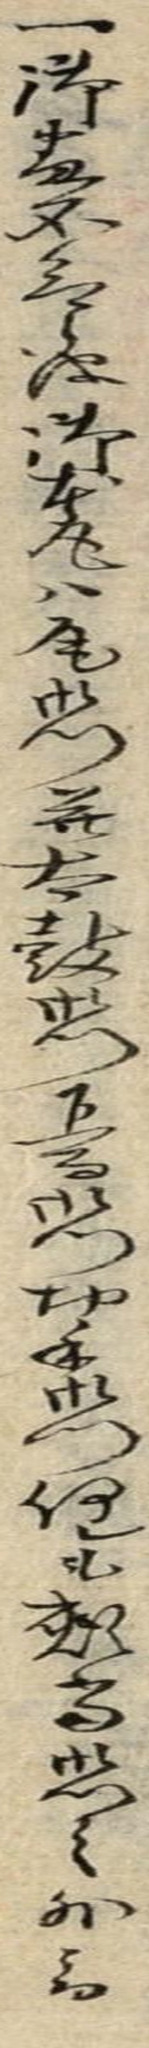一御番不参之儀御本丸は瓦御門并太鼓御門下馬御門切手御門何れも頬当御門之外に而
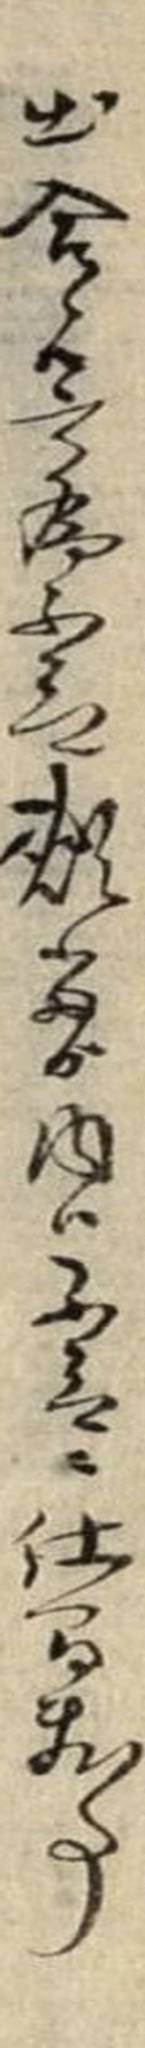出合候は可為不参頬当ゟ内は不参に仕間敷候事
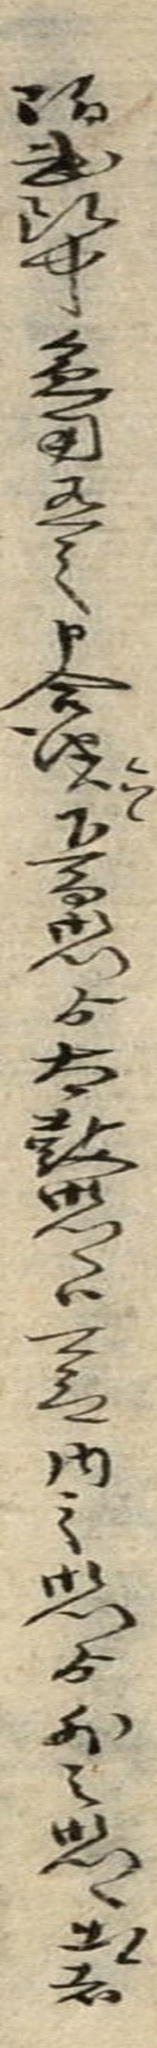附武頭中急用有之申合儀は下馬御門ゟ太鼓御門へは可参内之御門ゟ外之御門へ出候者
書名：蒐輯之部
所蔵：福井県文書館 Fukui Prefectural Archives
